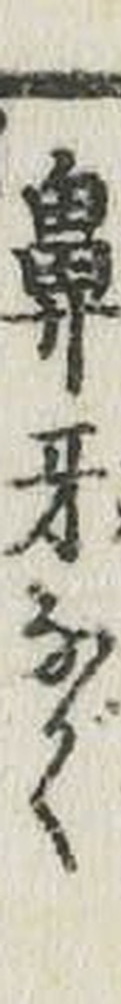鼻牙ながく
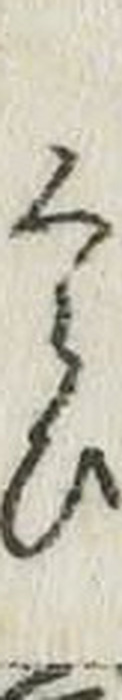くらひ
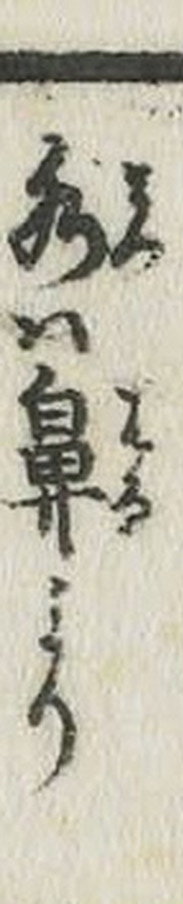水は鼻より
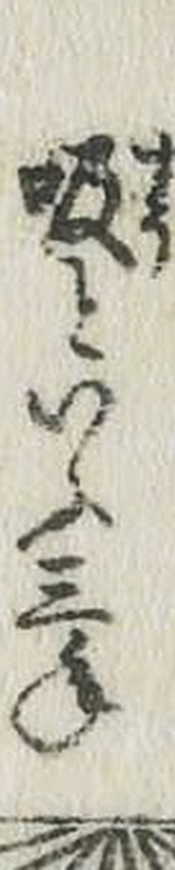吸といふ三年
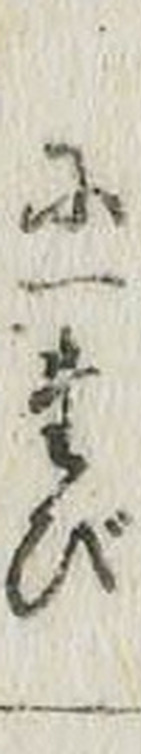に一たび
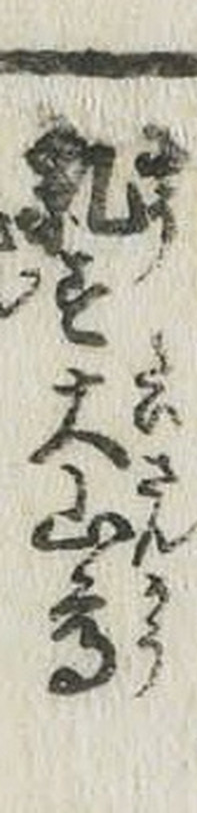乳す大山高
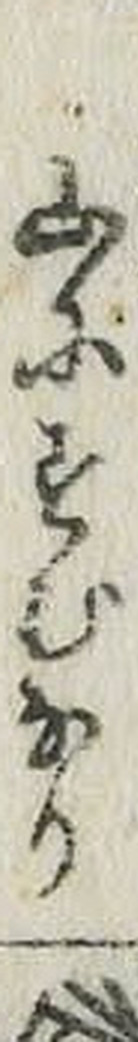山にすむなり
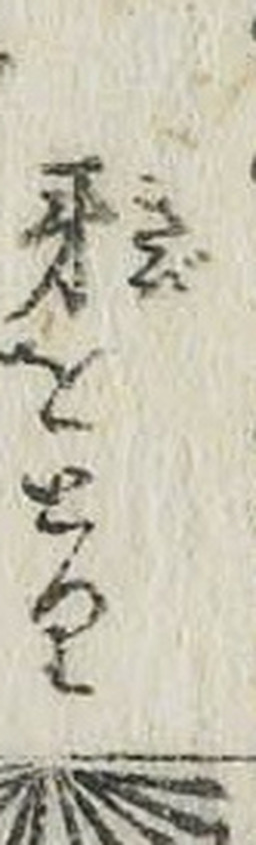牙をとり
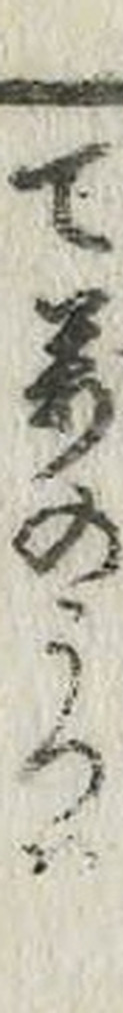て万のうつは
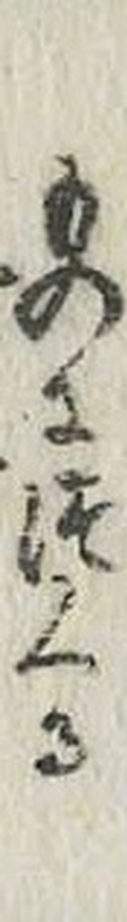ものにつくる
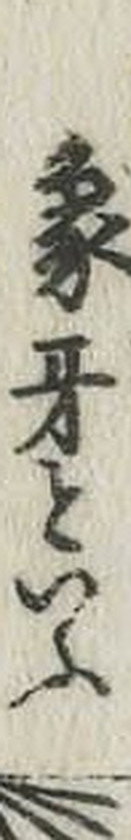象牙といふ

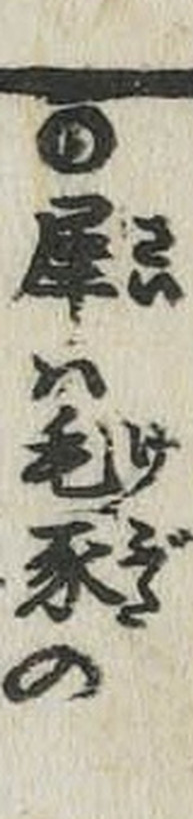○犀は毛豕の
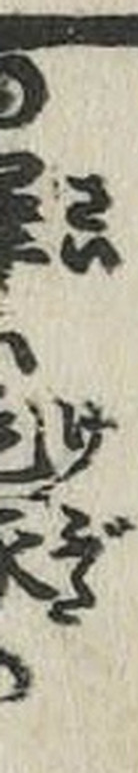○犀は毛豕の
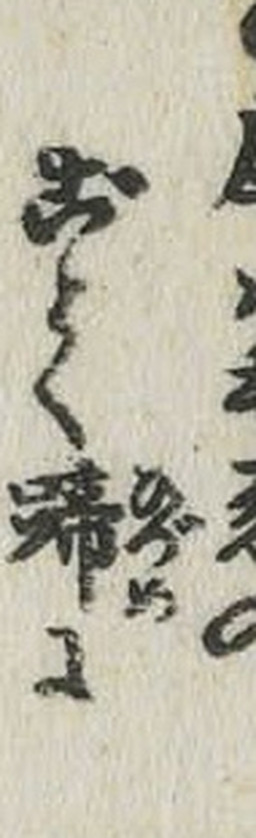ごとく蹄に
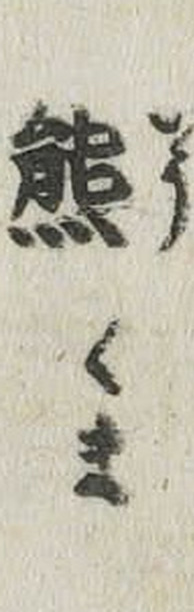熊くま
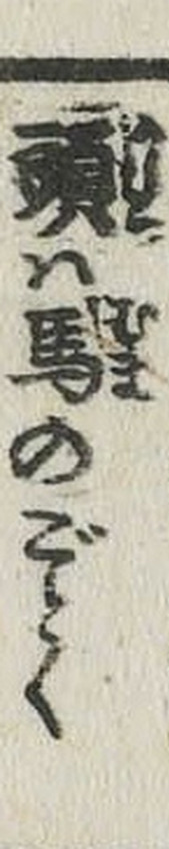頭は馬のごとく
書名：増補頭書訓蒙図彙大成 10巻 6:巻之12-13
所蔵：東京学芸大学教育コンテンツアーカイブ
